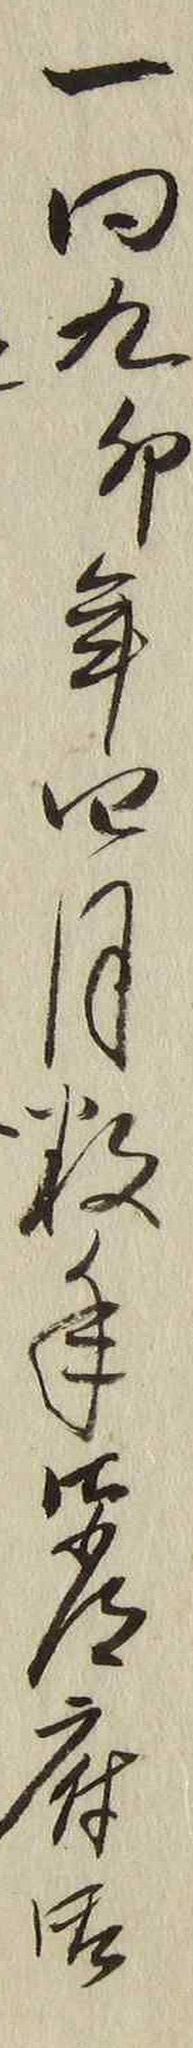一同九卯年四月数年御常雇御
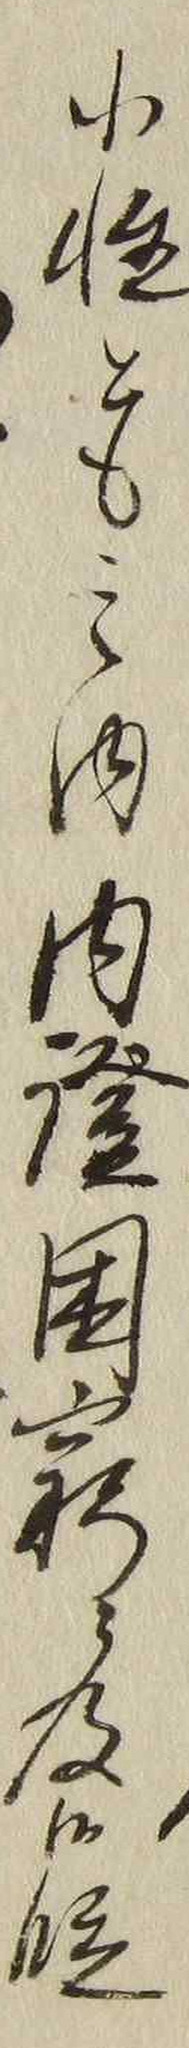小性とも之内内証困窮ニ及候段
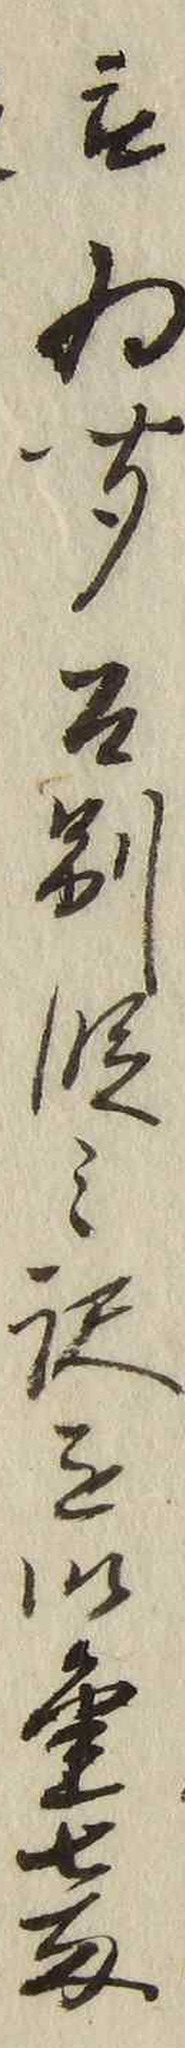被為聞召別段之訳を以金七両
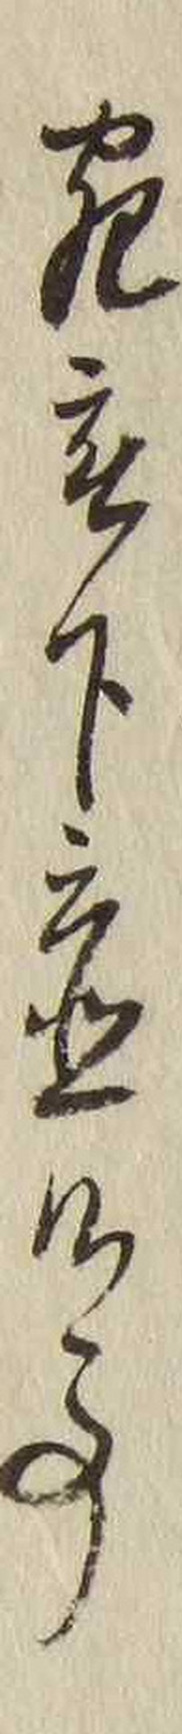宛被下置候事

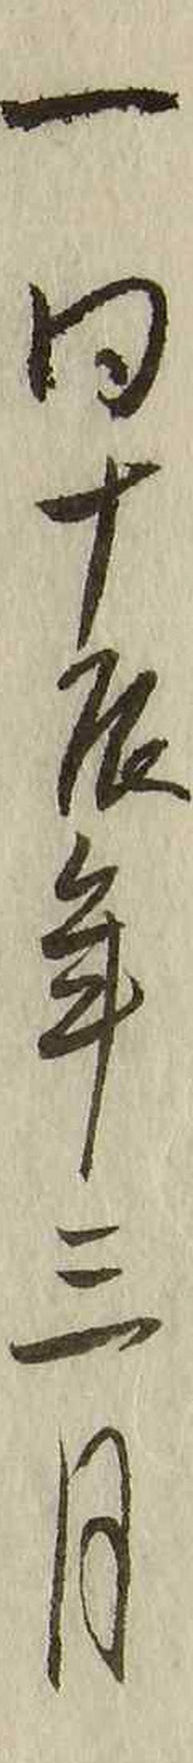一同十辰年三月
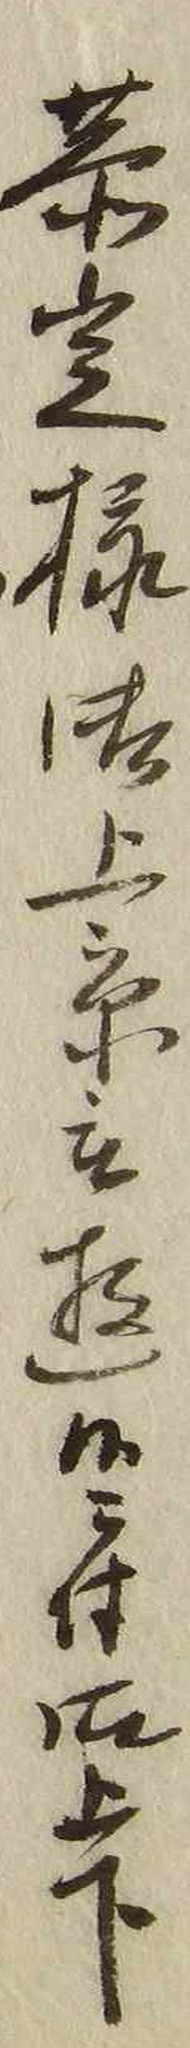恭定様御上京被遊候ニ付御上下
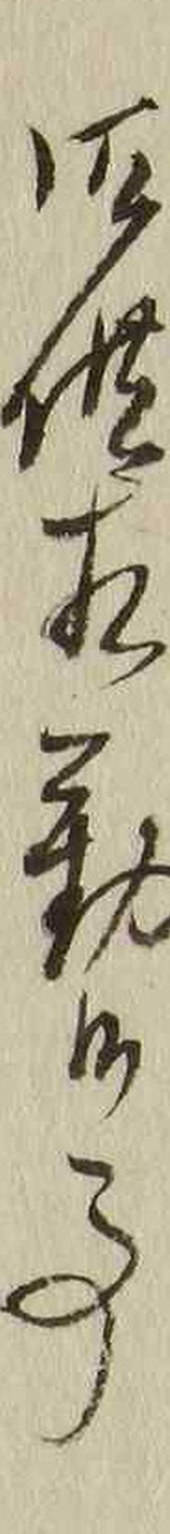御供相勤候事
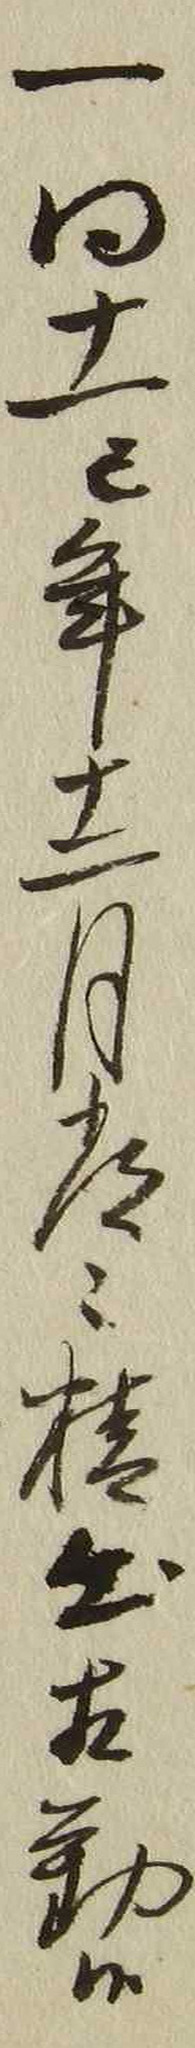一同十一巳年十二月常々精出相勤候
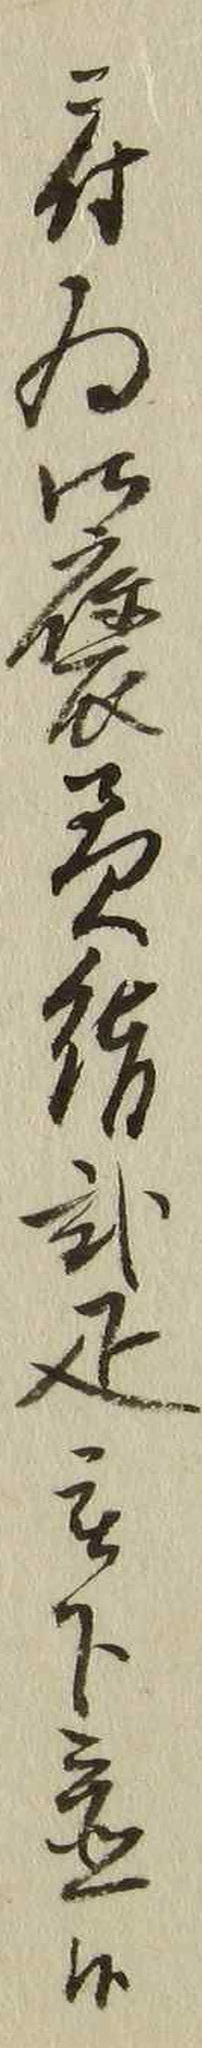ニ付為御褒美絹弐疋被下置候
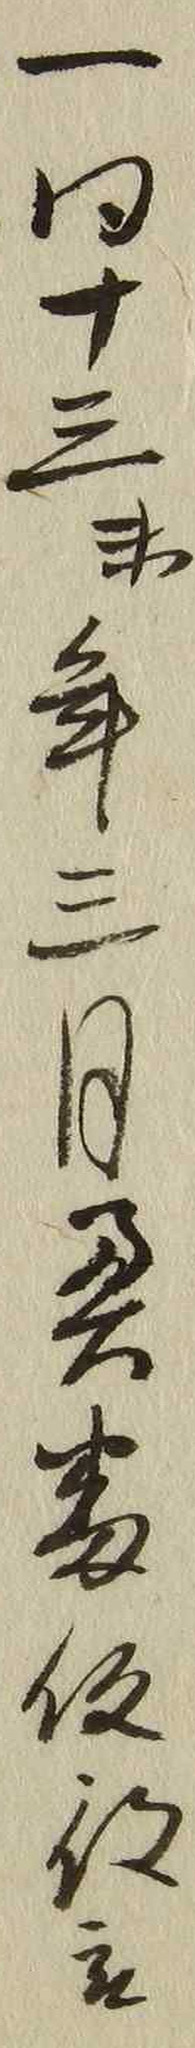一同十三未年三月奥番仮役被
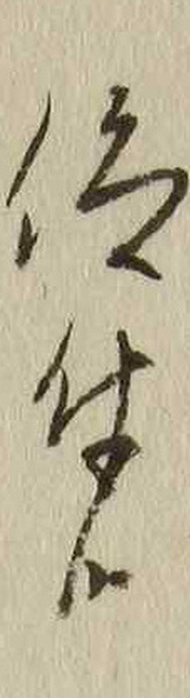仰付候
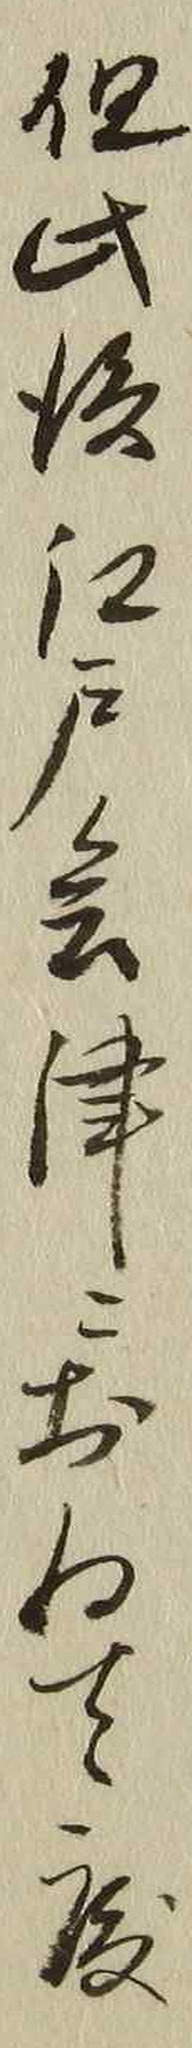但此後江戸会津ニおゐて度
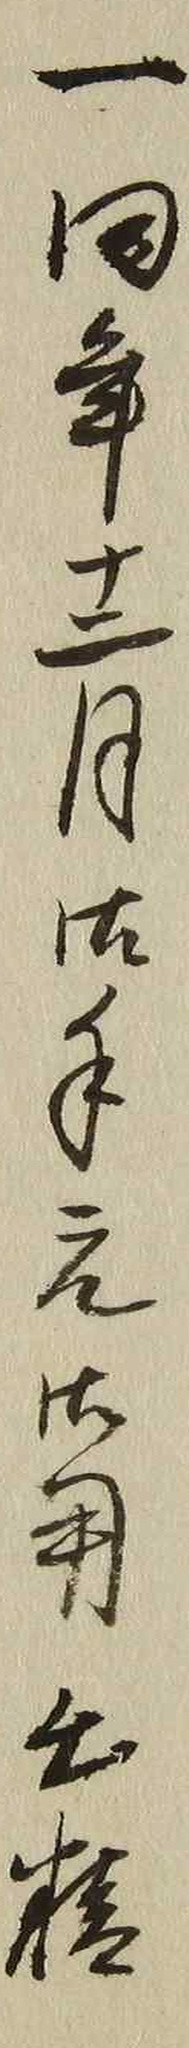一同年十二月御手元御用出精
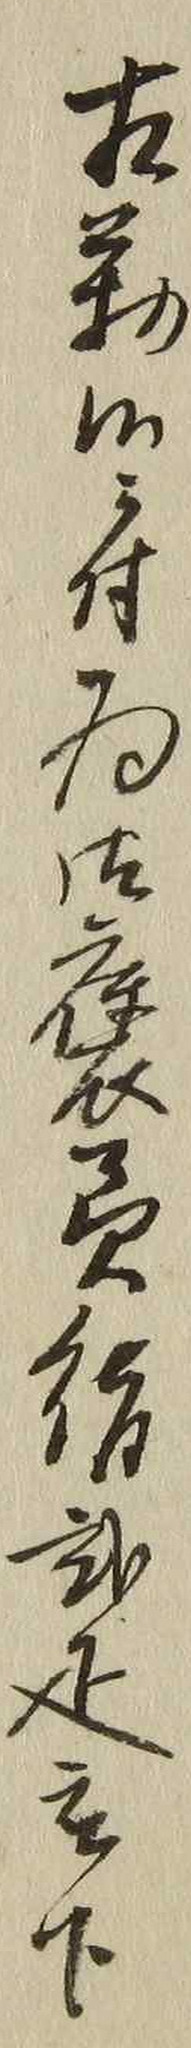相勤候ニ付為御褒美絹弐疋被下
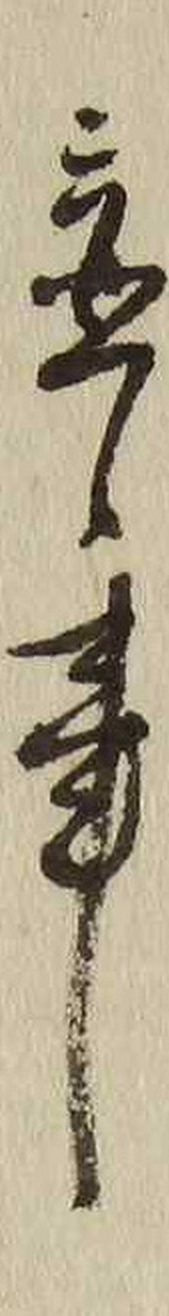置候事
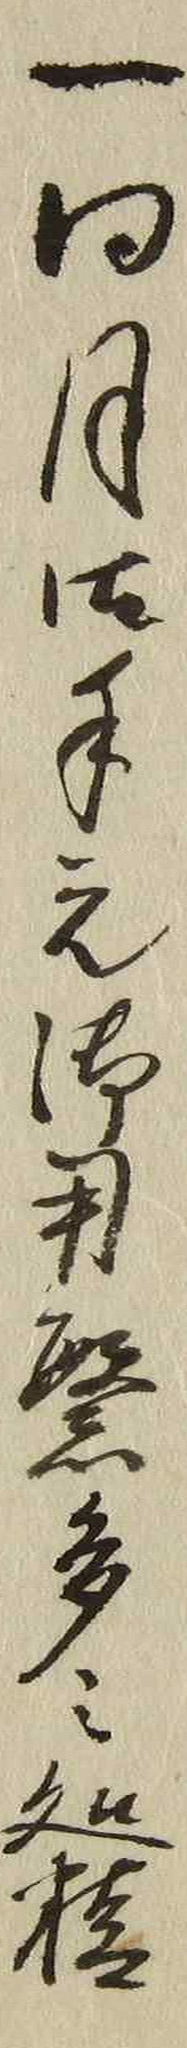一同月御手元御用繁多之処精
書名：諸士系譜　巻之359　す之部9
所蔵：会津若松市立会津図書館
